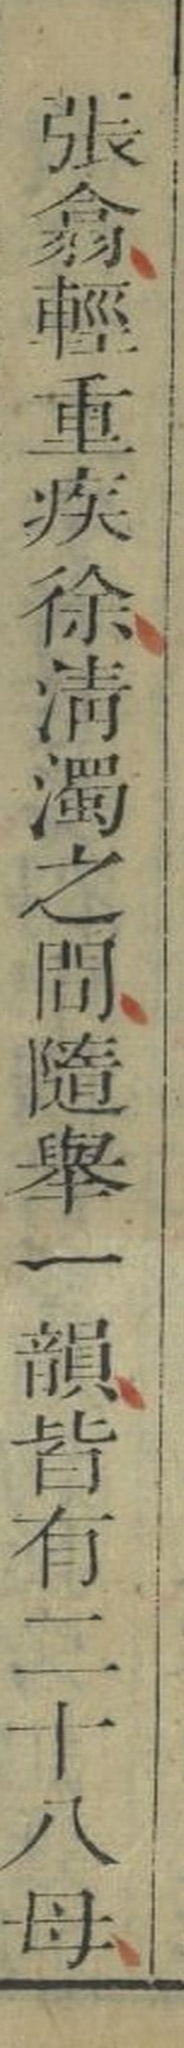張翕軽重疾徐清濁之間随挙一韻皆有二十八母
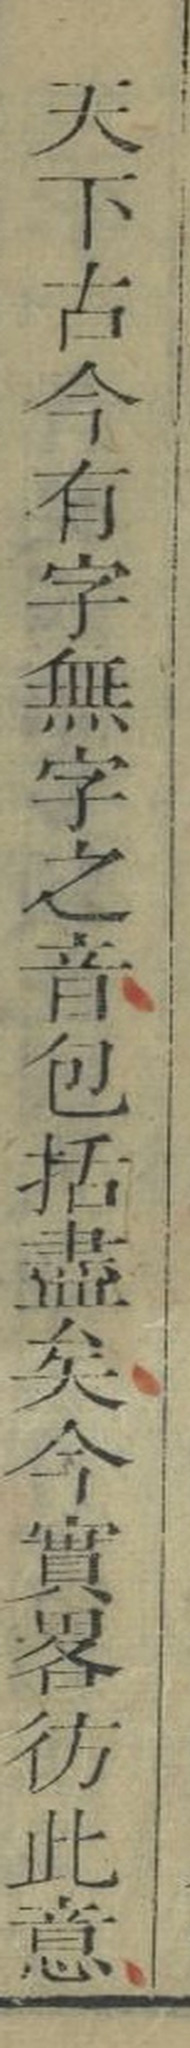天下古今有字無字之音包括尽矣今実略彷此意
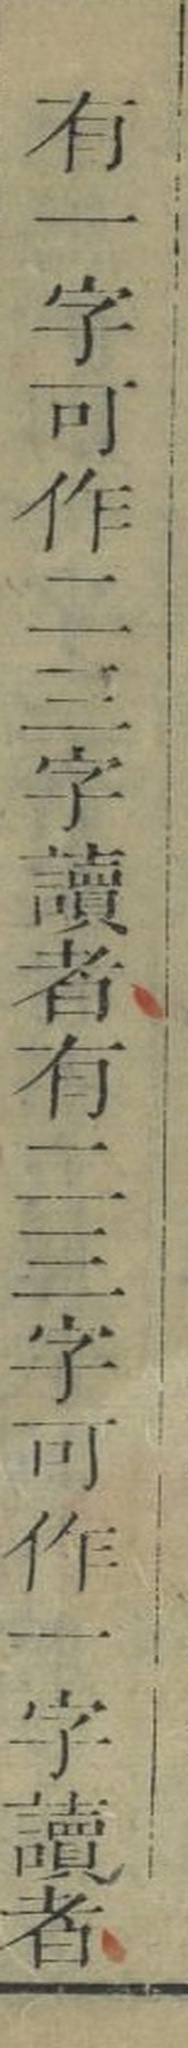有一字可作二三字読者有二三字可作一字読者
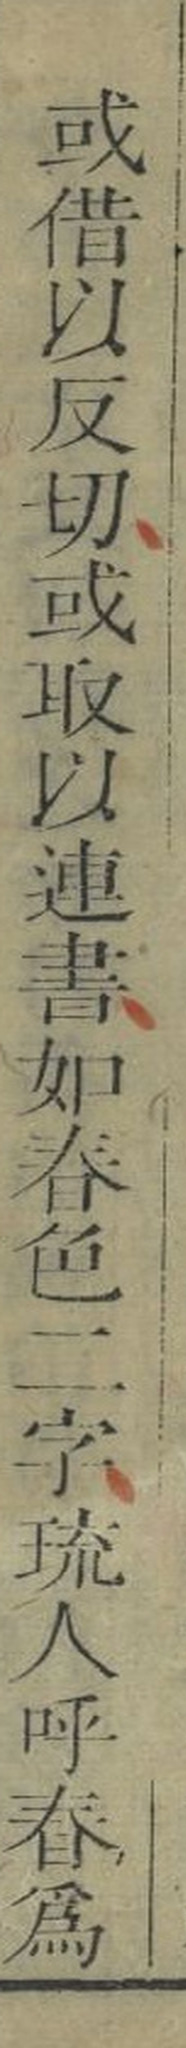或借以反切或取以連書如春色二字琉人呼春為
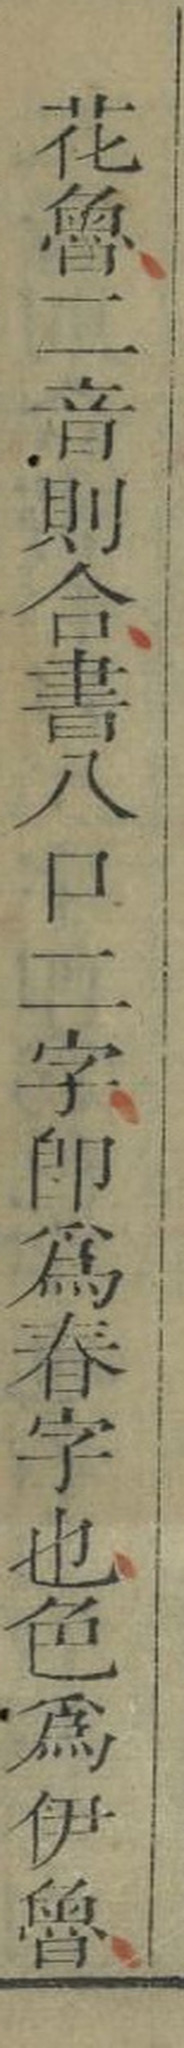花魯二音則合書八口二字即為春字也色為伊魯

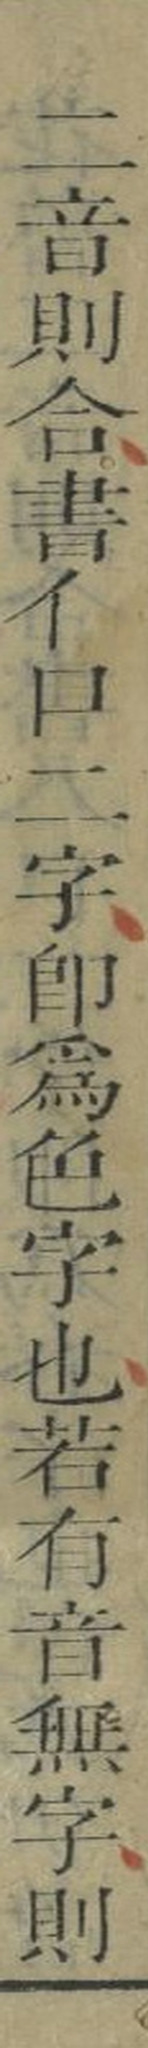二音則合書イロ二字即為色字也若有音無字則
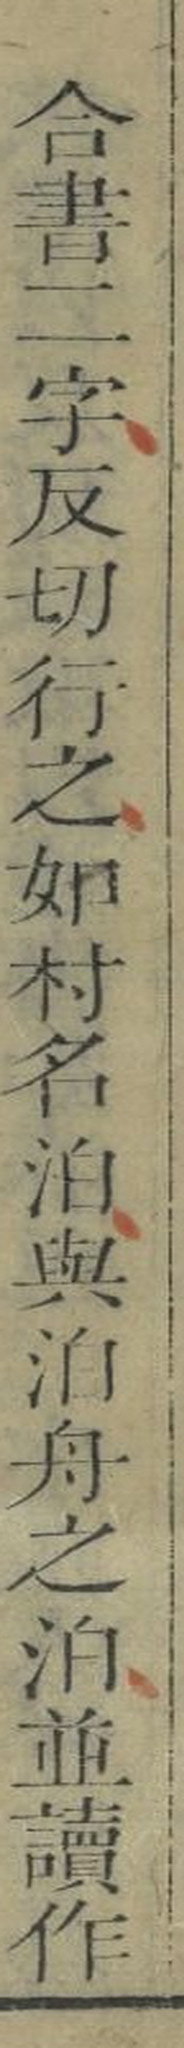合書二字反切行之如村名泊与泊舟之泊並読作
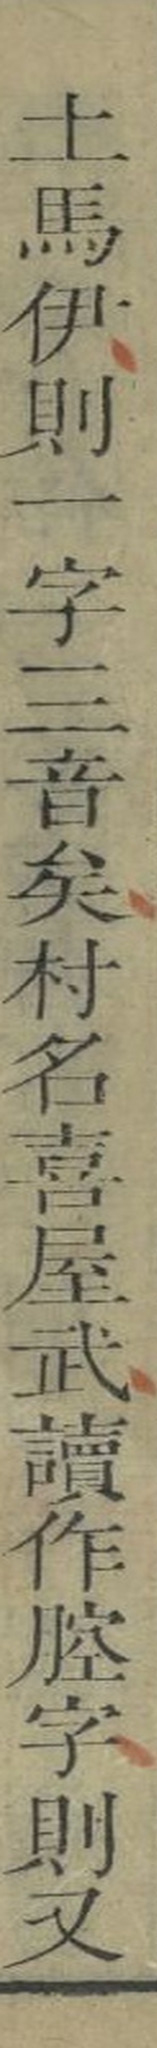土馬伊則一字三音矣村名喜屋武読作腔字則又
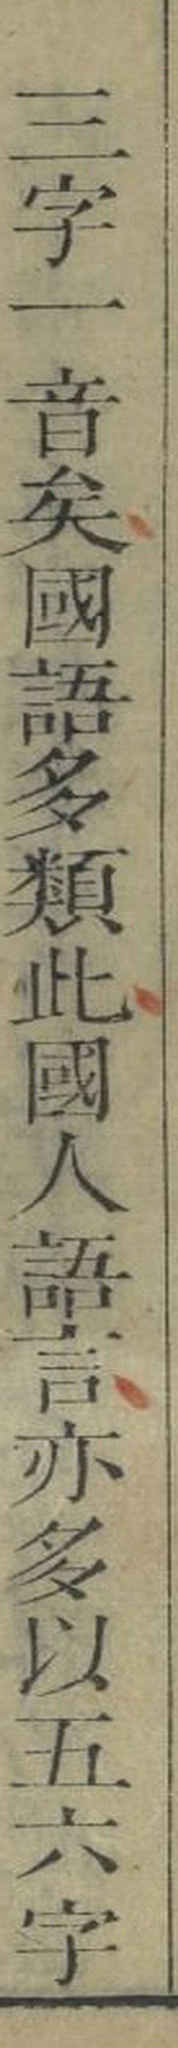三字一音矣国語多類此国人語言亦多以五六字
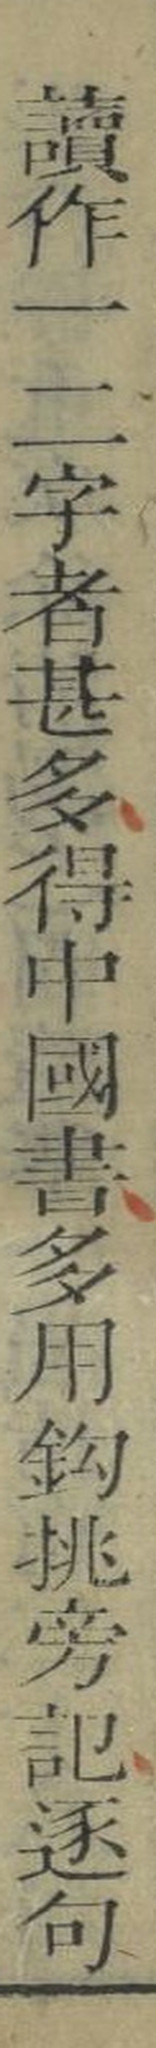読作一二字者甚多得中国書多用鈎挑旁記逐句
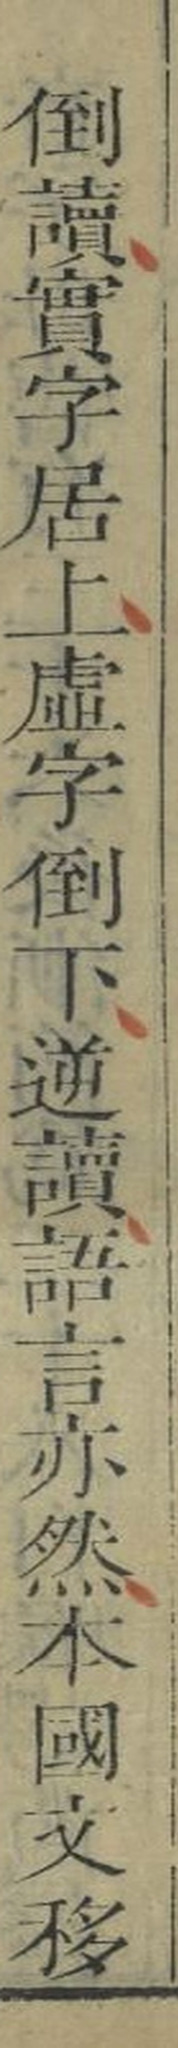倒読実字居上虚字倒下逆読語言亦然本国文移
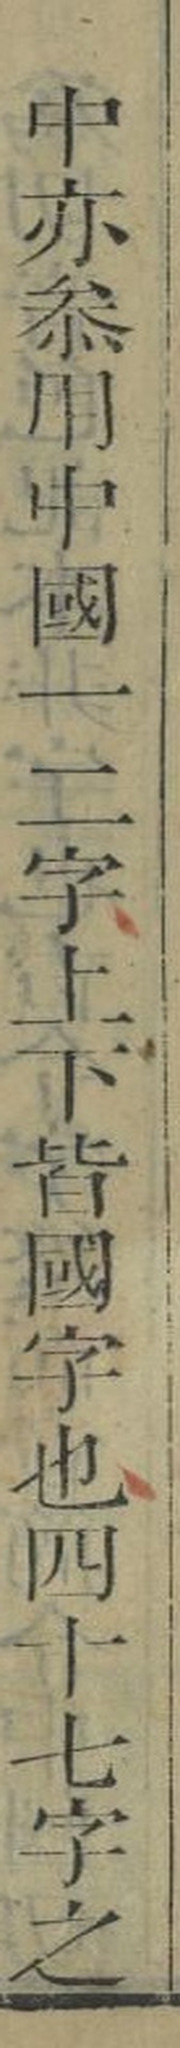中亦参用中国一二字上下皆国字也四十七字之
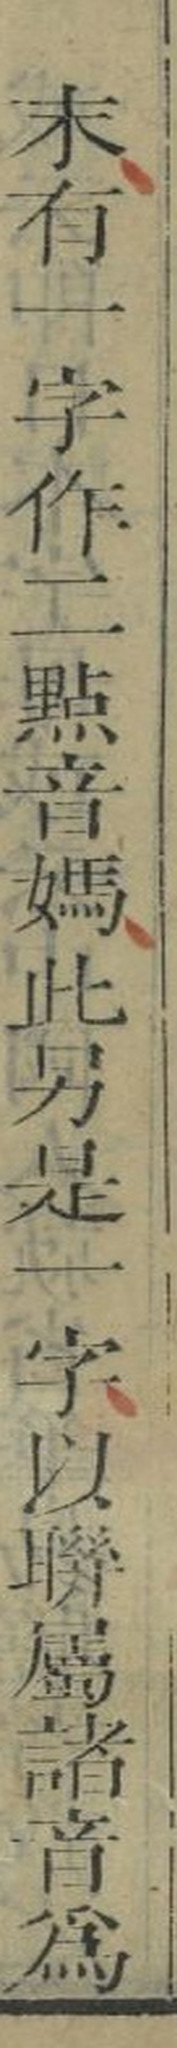末有一字作二点音媽此另是一字以聯属諸音為
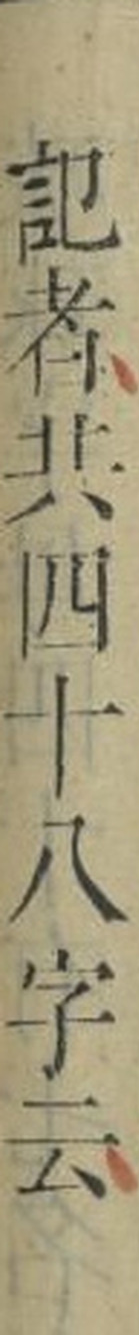記者共四十八字云
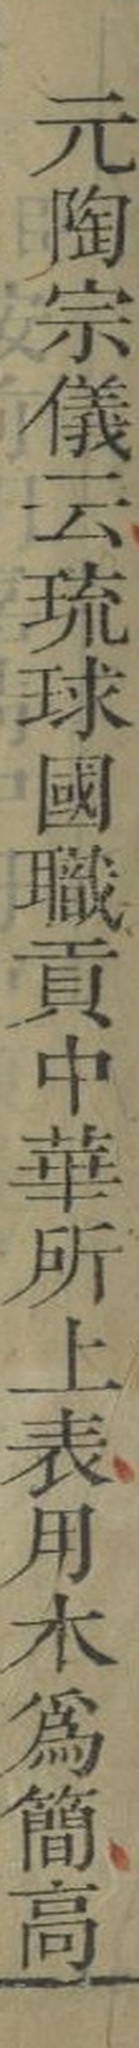元陶宗儀云琉球国職貢中華所上表用木為簡高
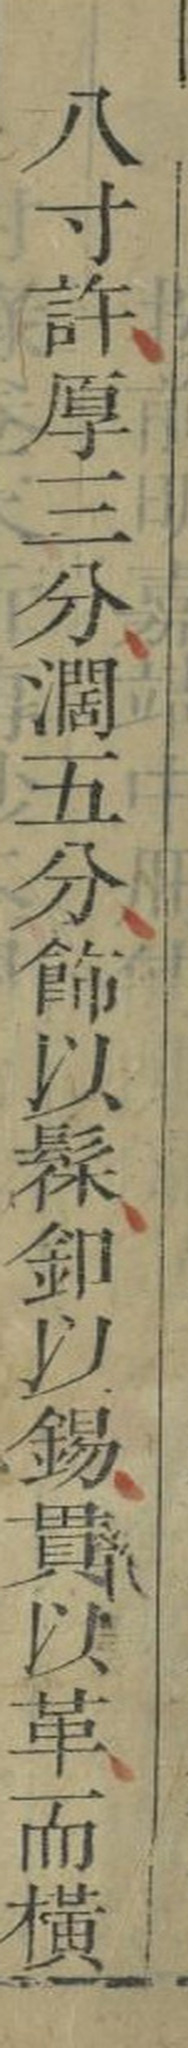八寸許厚三分濶五分飾以髹釦以錫貫以革而横
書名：中山伝信録 巻六
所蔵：University of the Ryukyus Library
